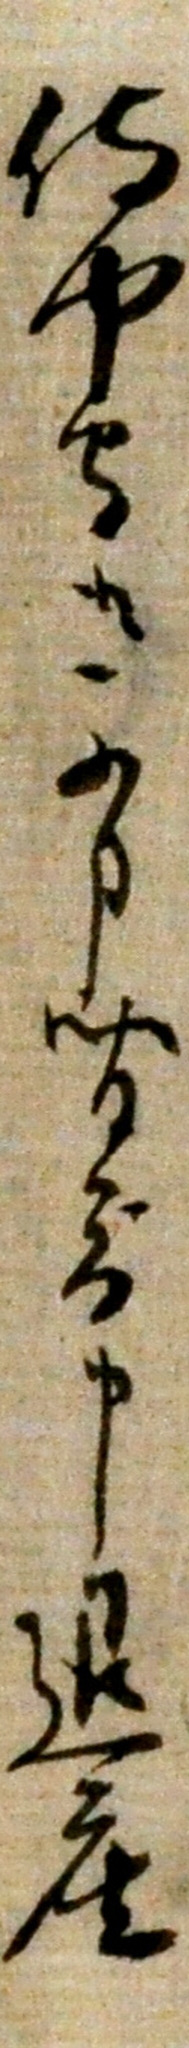備中守え可申聞旨申退座
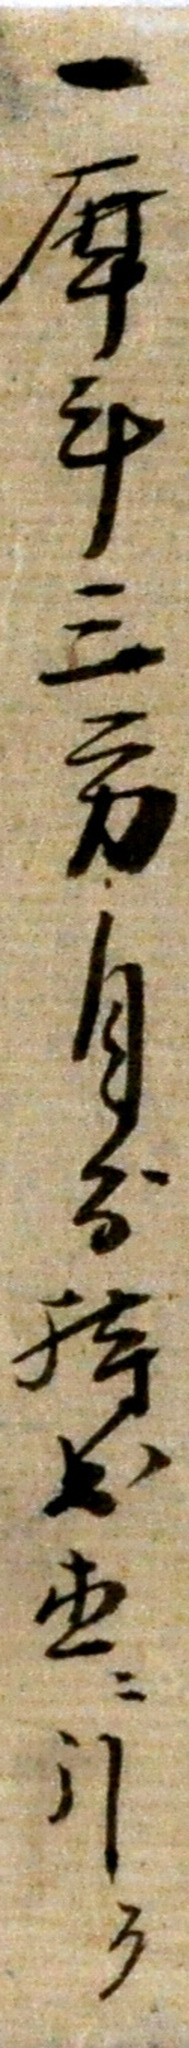一熨斗三方自分持出直ニ引ク
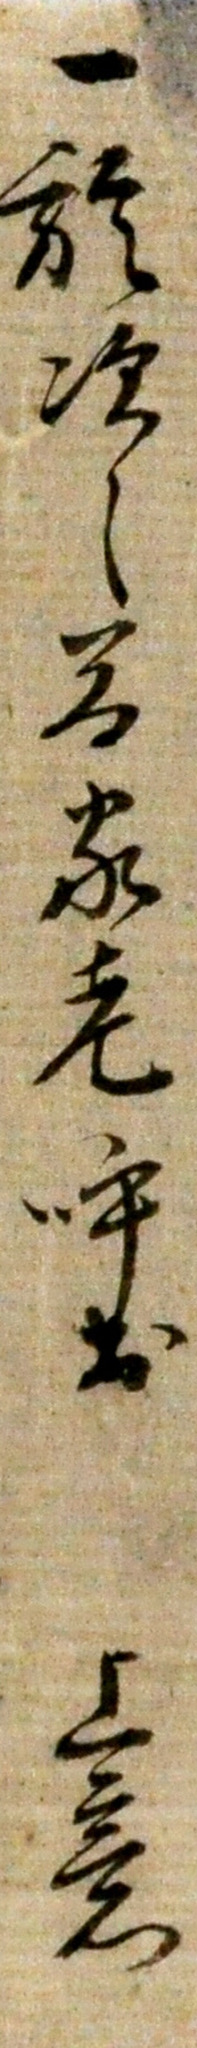一於次之間家老呼出上意
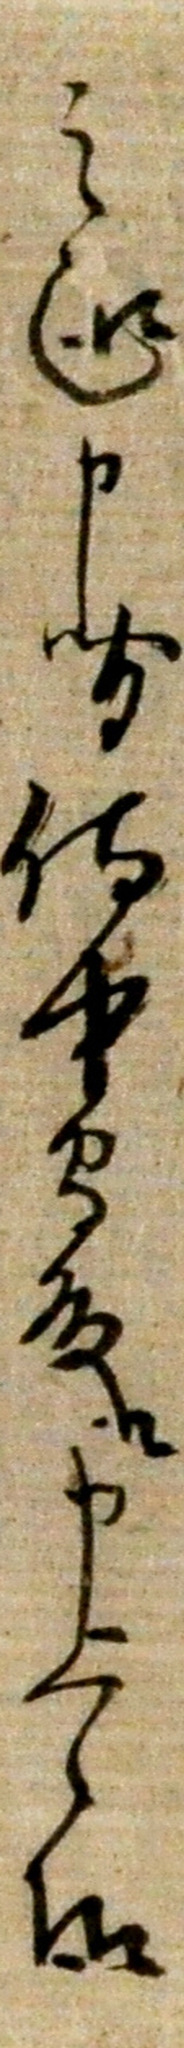之趣申聞備中守殿え申上候様
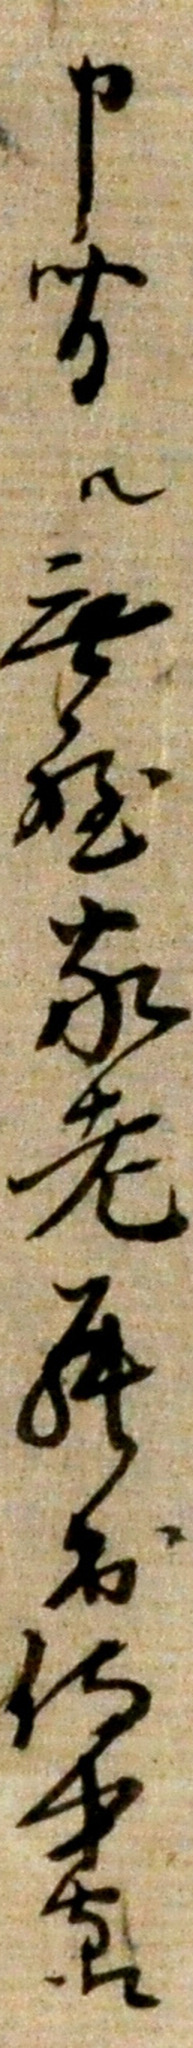申聞候無程家老罷出備中守え
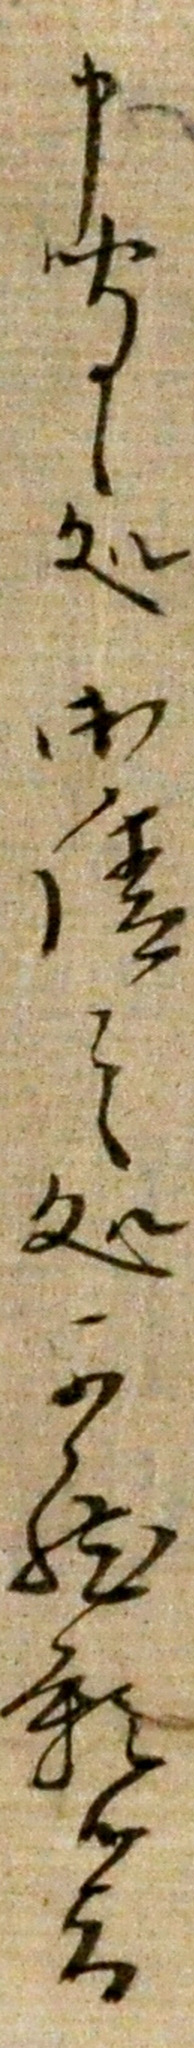申聞候処御請之処可然願候旨
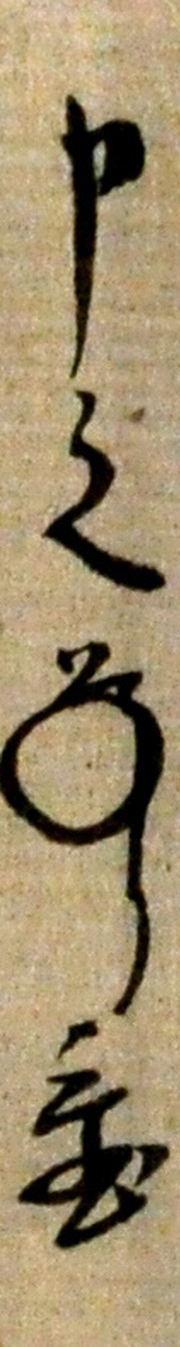申之承り置
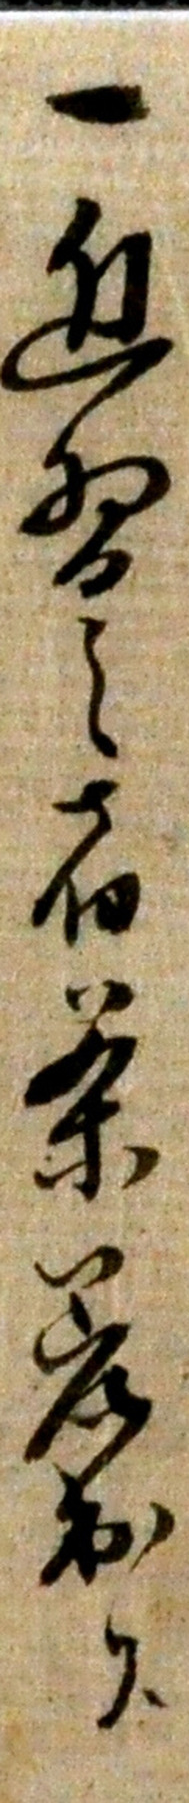一近習之者茶差出ス
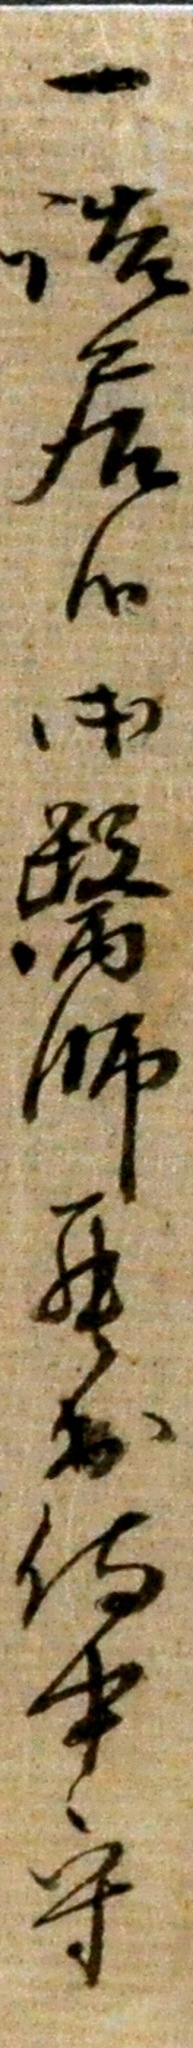一詰居候御医師罷出備中守
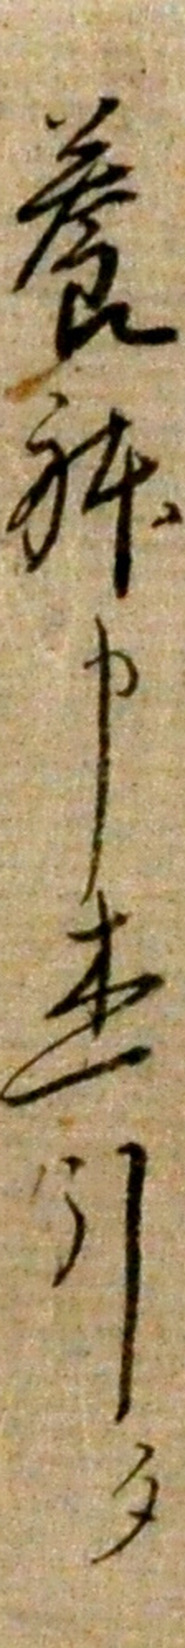養躰申述引ク
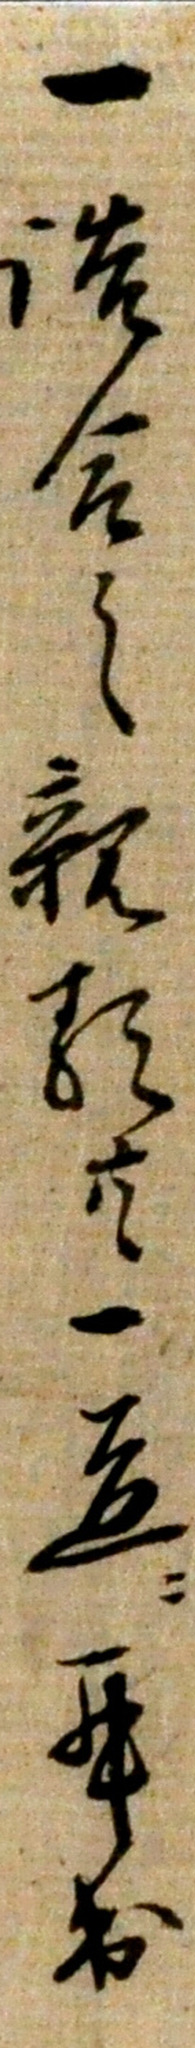一詰合之親類共一並ニ罷出
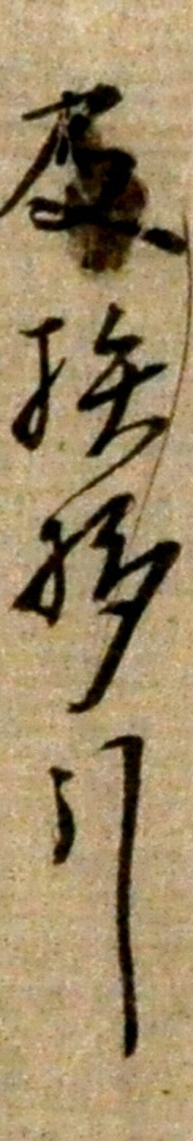及挨拶引
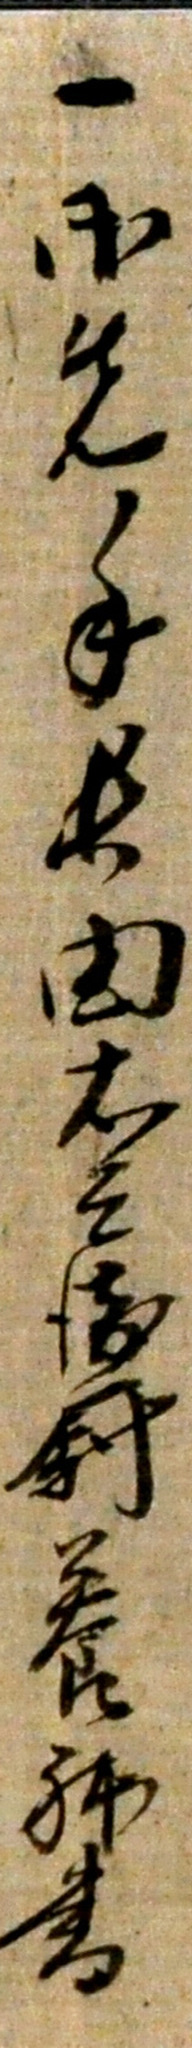一御先手長田右兵衛尉養躰書
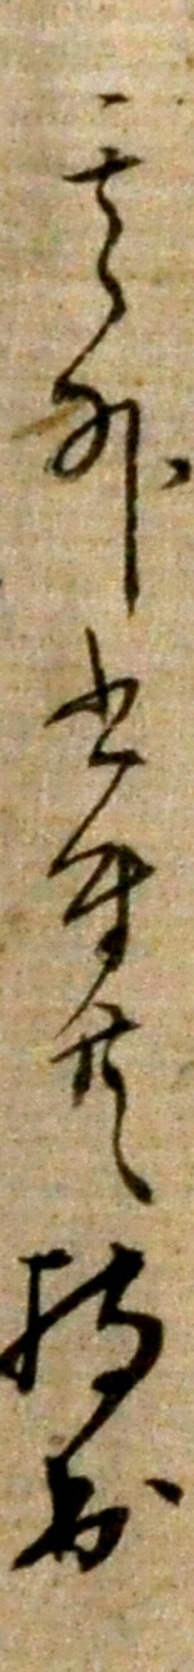其外書付共持出
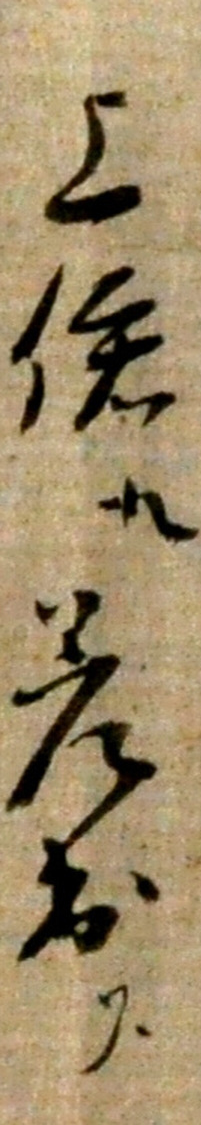上使え差出ス

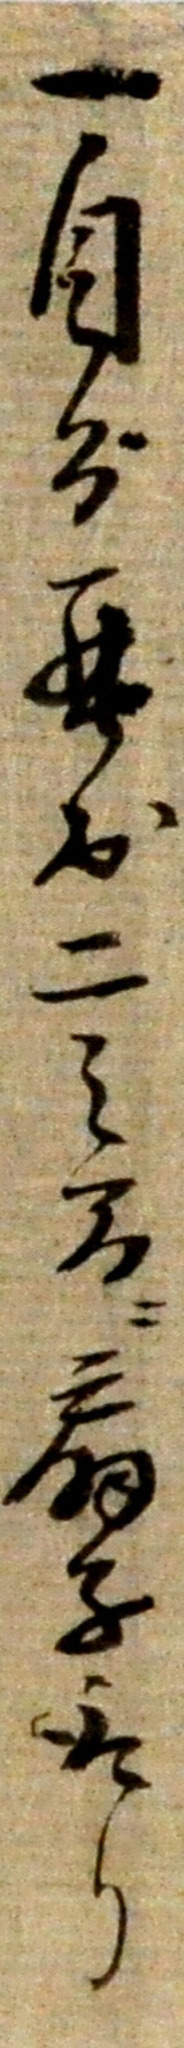一自分罷出二之間ニ扇子取り
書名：上使仰付ラレ候節ノ留外
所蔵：伊那市立高遠町図書館・合同会社AMANE
